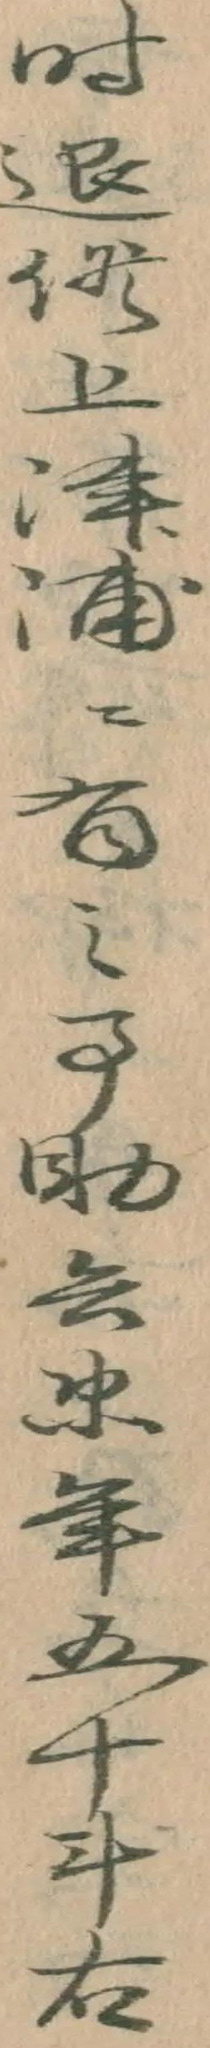時退候上津浦に有之事助兵衛年五十斗右
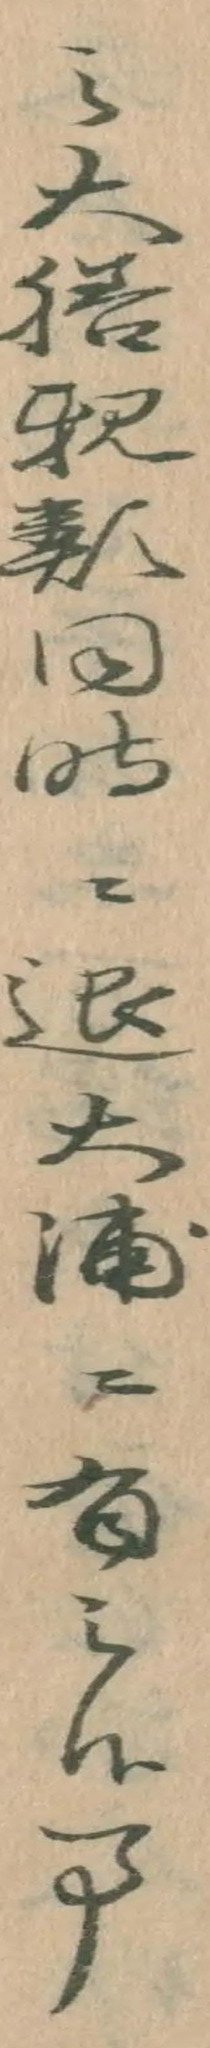之大膳親類同時に退大浦に有之候事
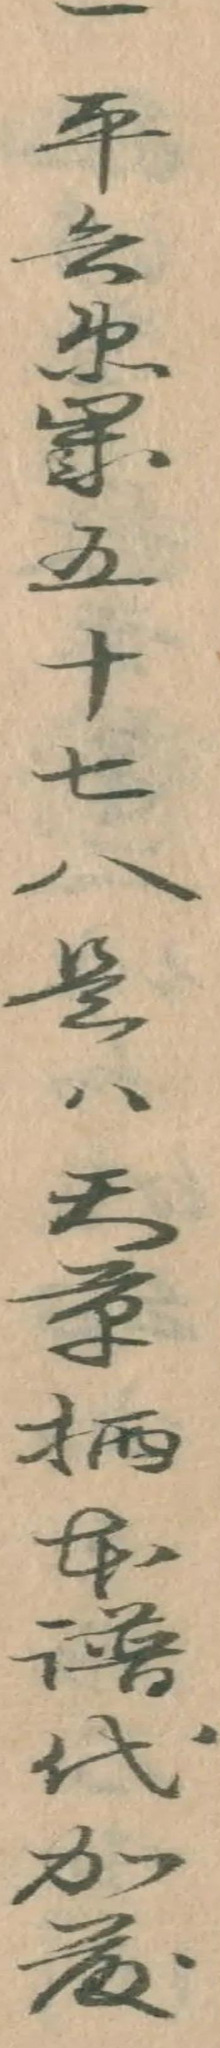一平兵衛歳五十七八是は天草柄本譜代加藤

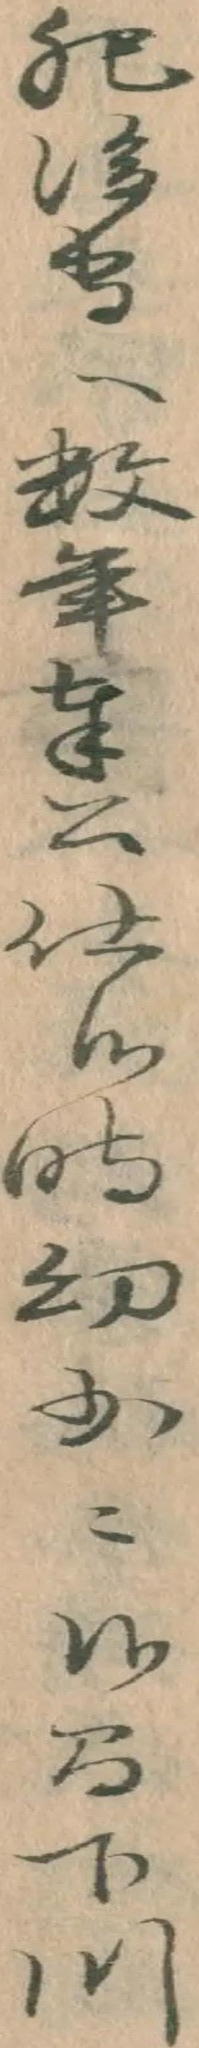肥後守へ数年奉公仕候時幼少に候間下川
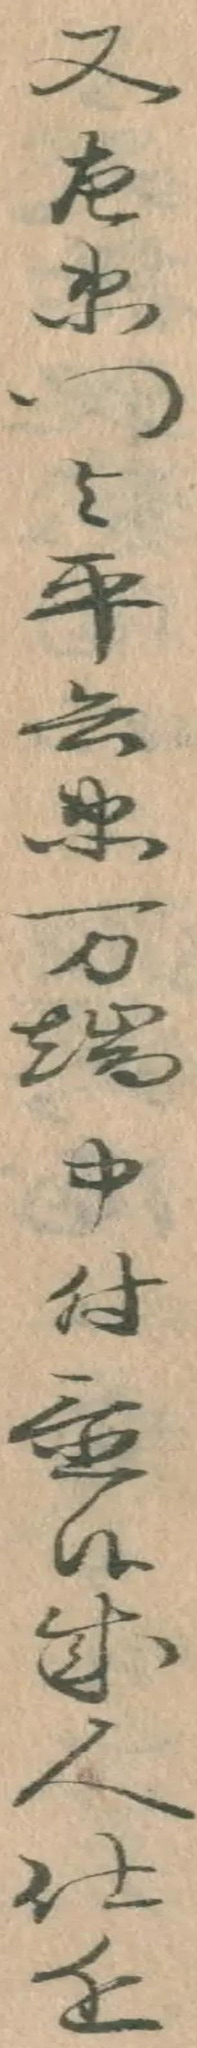又左衛門与平兵衛万端申付置候成人仕近
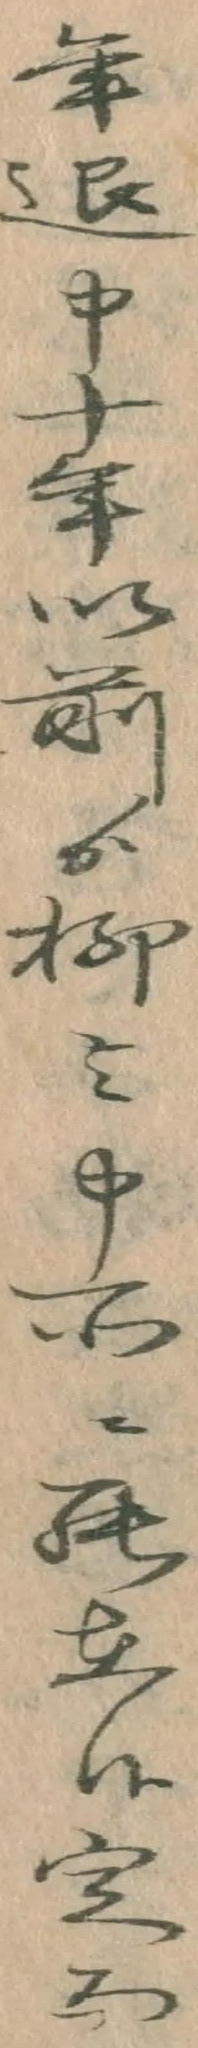年退申十年以前ゟ柳与申所に罷在候定而
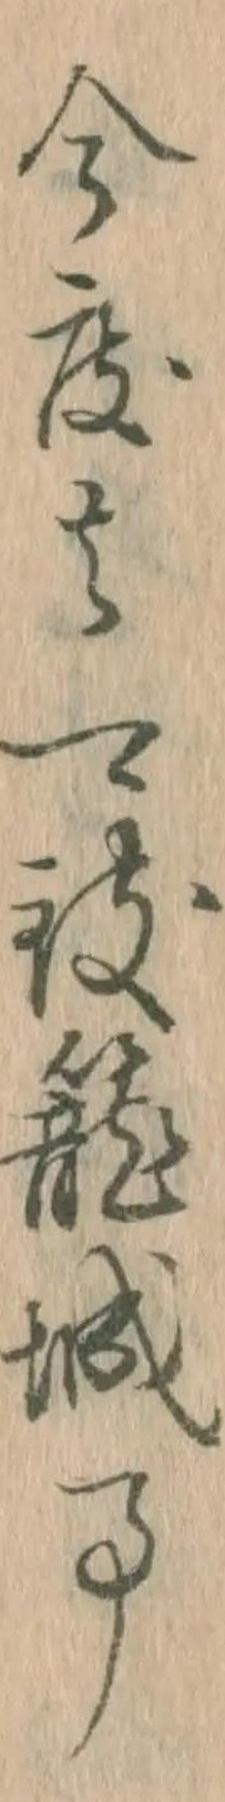今度者可致籠城事
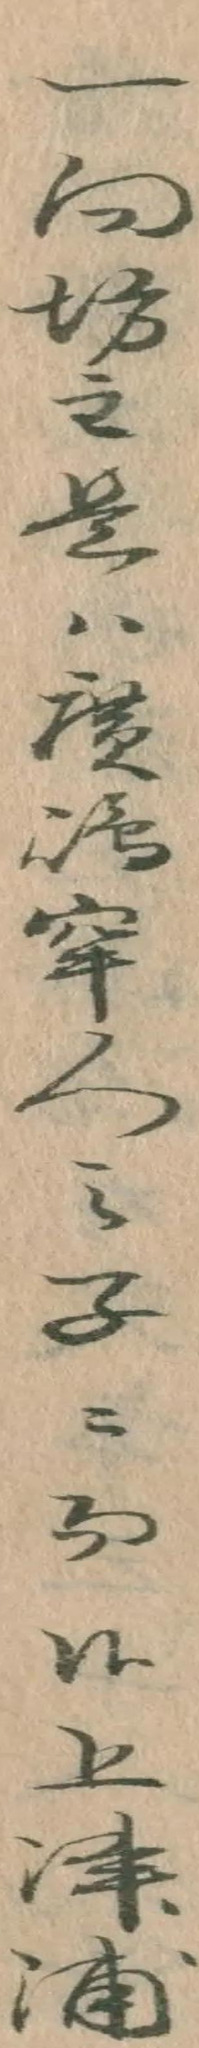一一向坊主是は広島牢人之子に而候上津浦
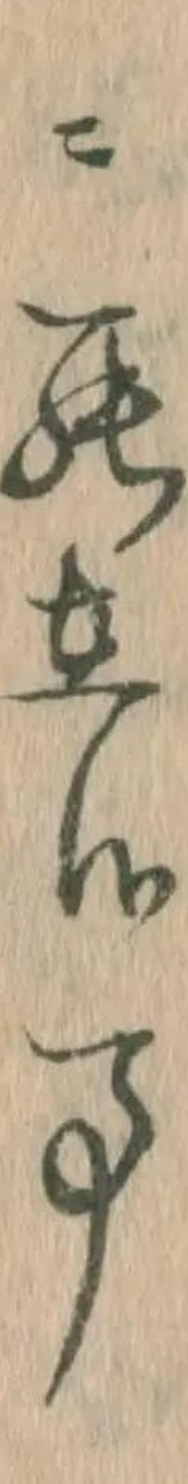に罷在候事
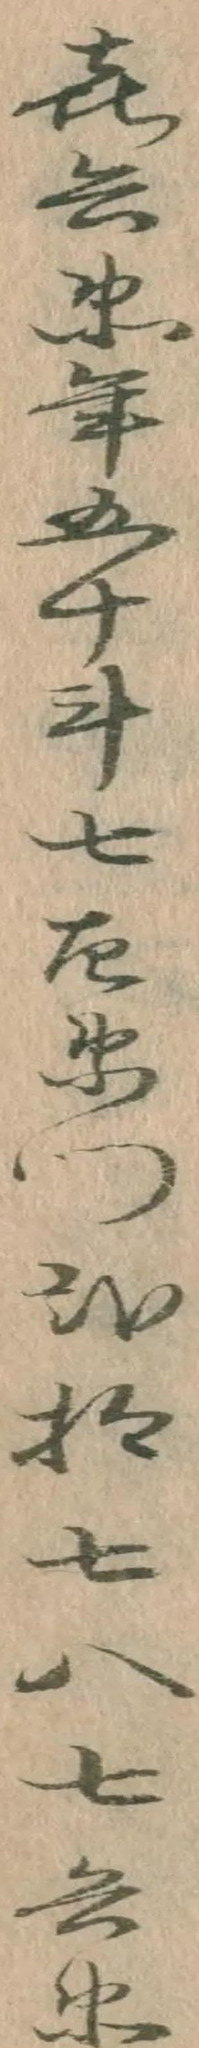一喜兵衛年五十斗七左衛門弐拾七八七兵衛
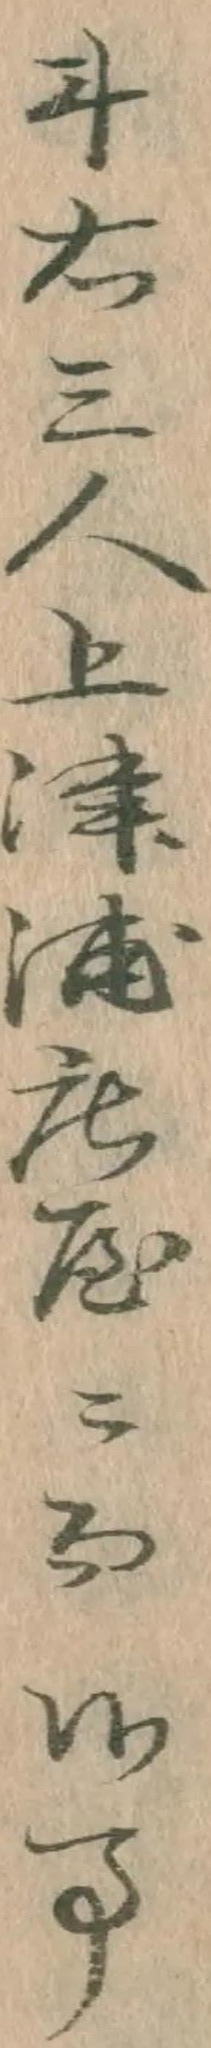斗右三人上津浦庄屋に而候事
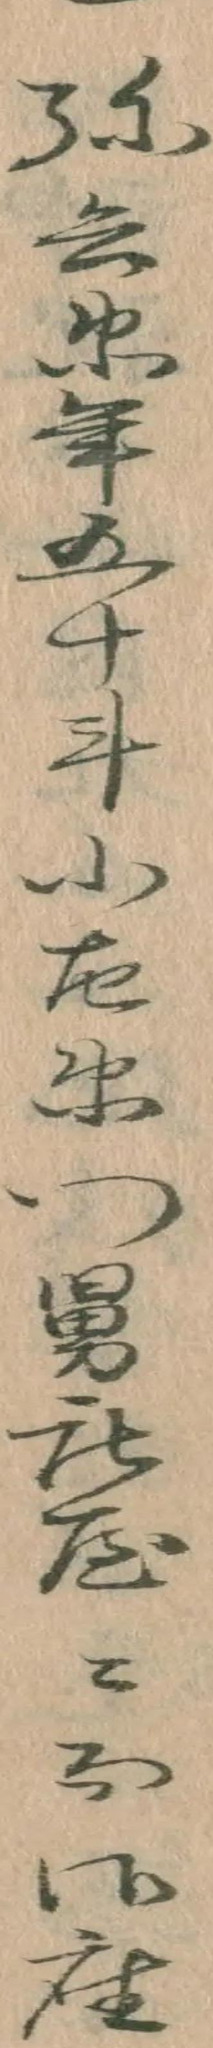一弥兵衛年五十斗小左衛門舅庄屋に而御座
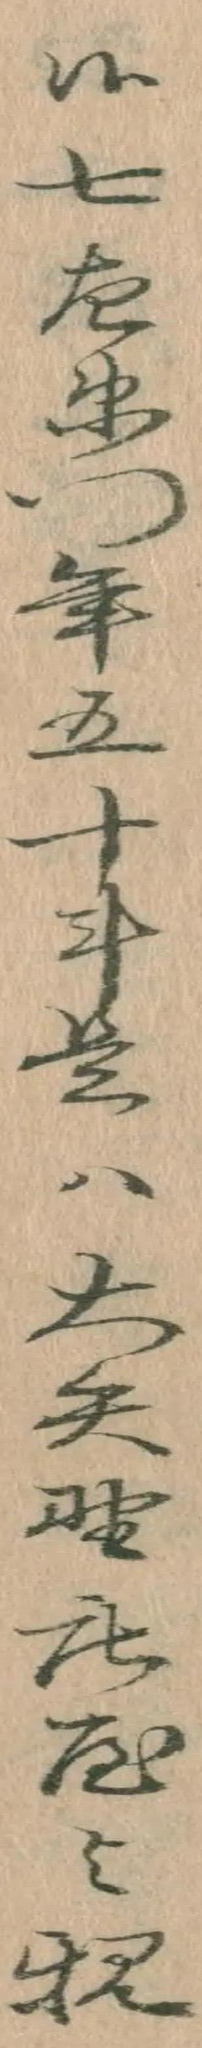候七左衛門年五十斗是は大矢野庄屋与親
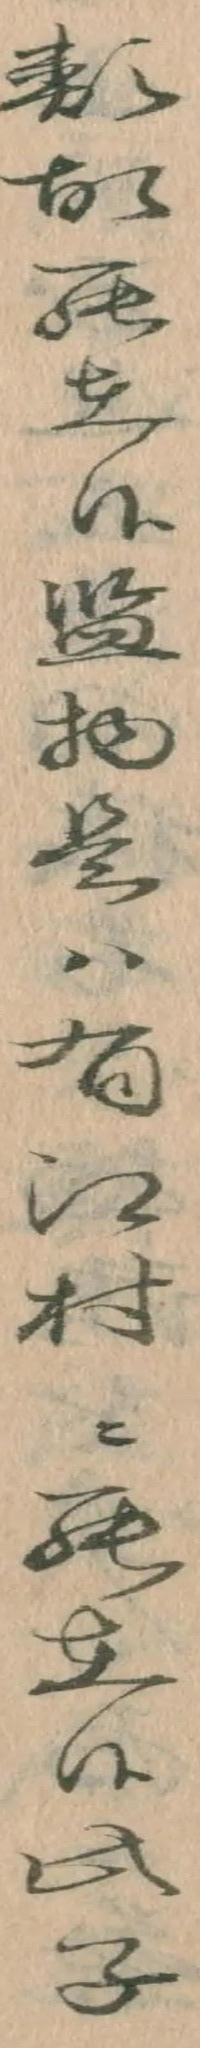類故罷在候監物是は有江村に罷在候此子
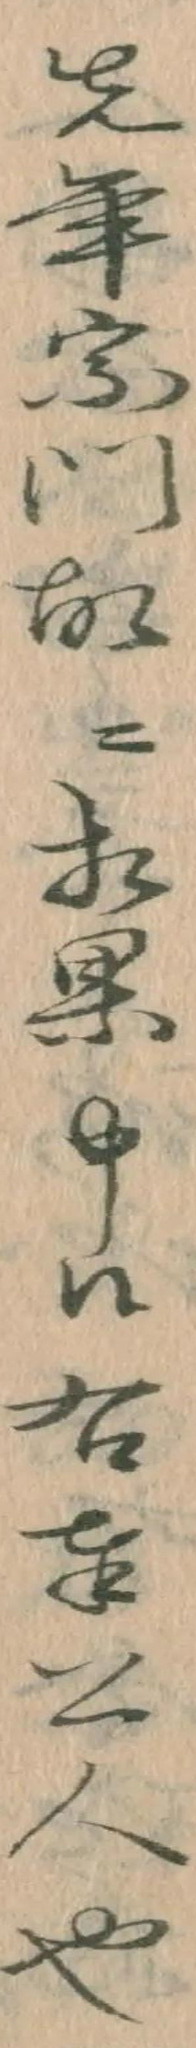先年宗門故に相果申候右奉公人也
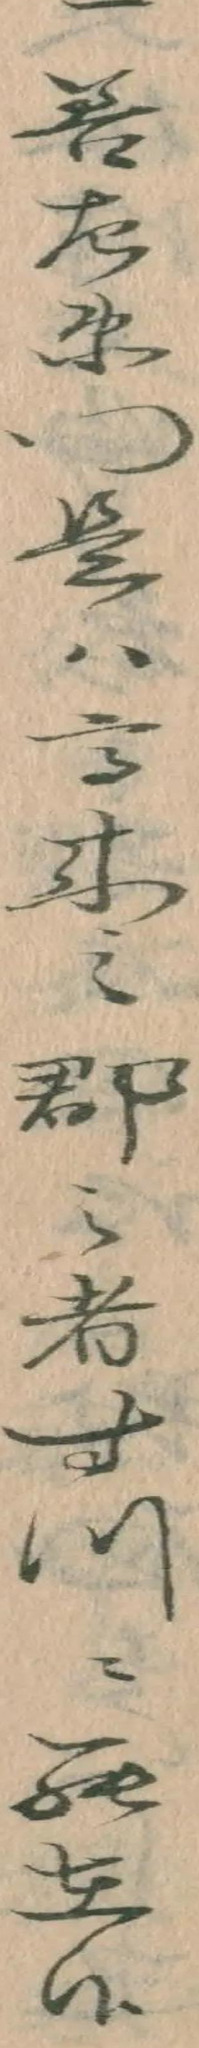一善左衛門是は高木之郡之者寸川に罷在候
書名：切支丹御退治記 49巻. [2]
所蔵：国立国会図書館 National Diet Library, JAPAN
